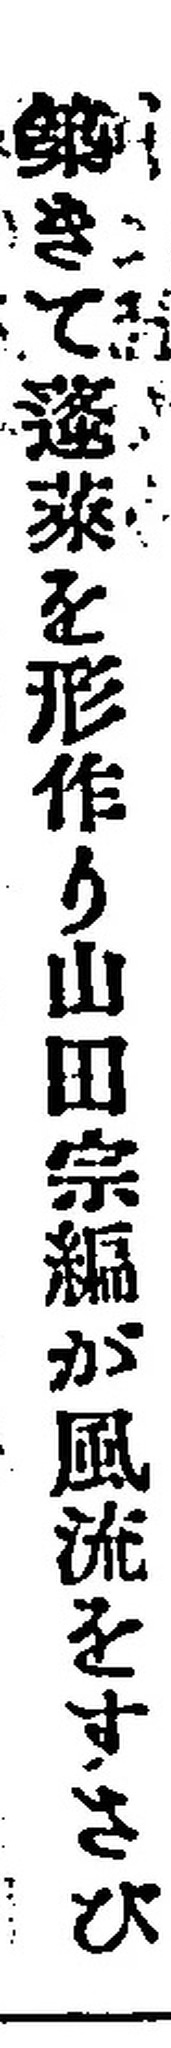築きて蓬莱を形作り山田宗編が風流をすさび
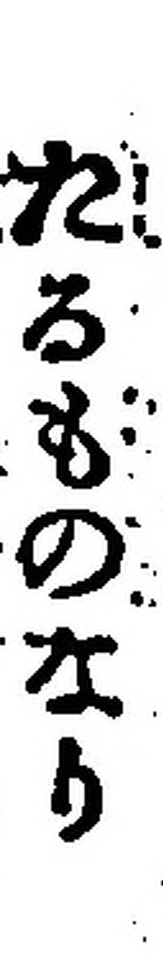たるものなり
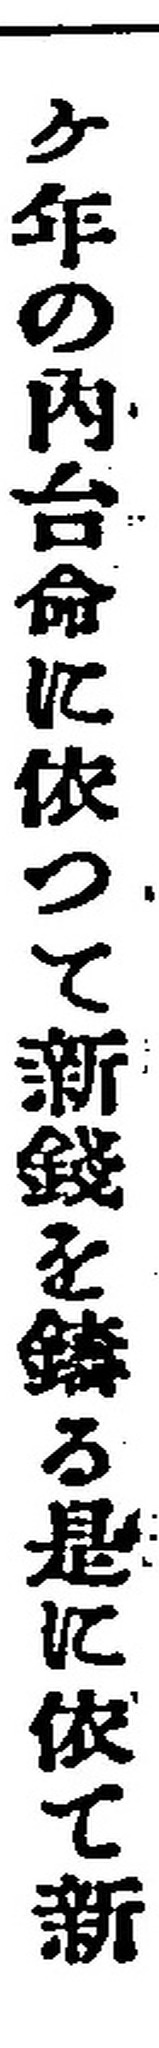ヶ年の内台命に依つて新銭を鋳る是に依て新
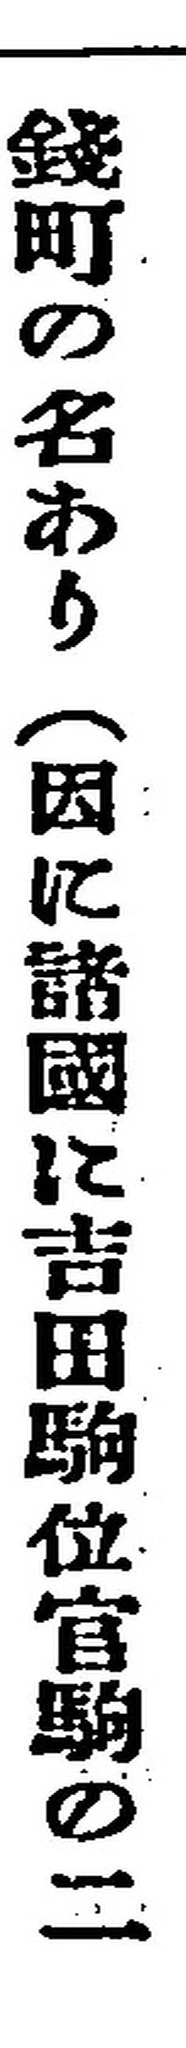銭町の名あり(因に諸国に吉田駒位官駒の二
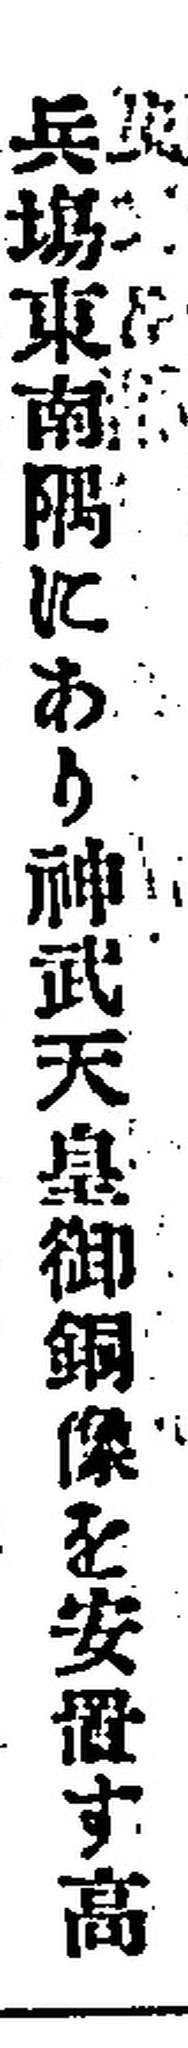兵場東南隅にあり神武天皇御銅像を安置す高
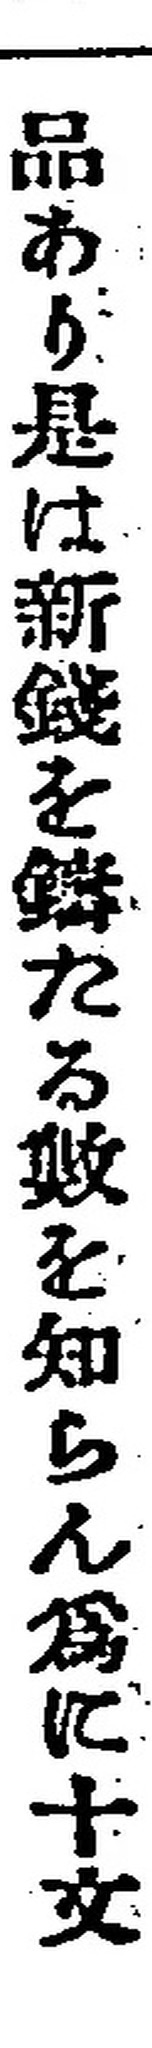品あり是は新銭を鋳たる数を知らん為に十文
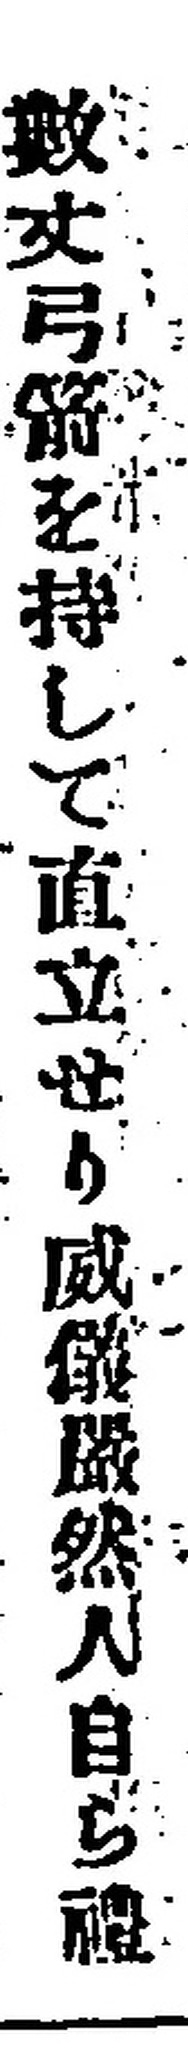数丈弓箭を持して直立せり威儀厳然人自ら礼
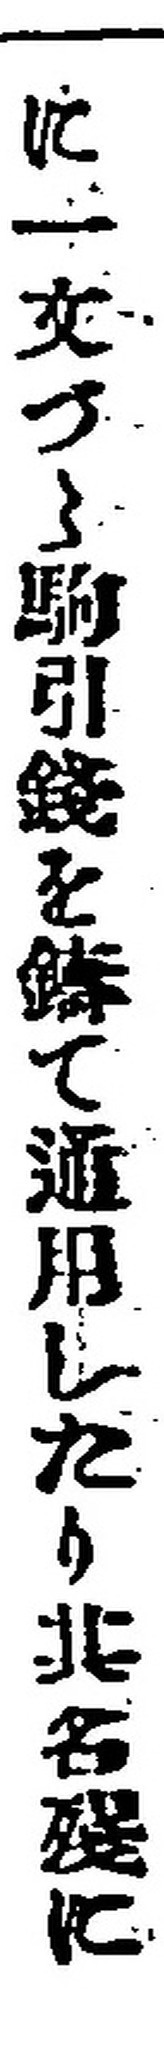に一文づゝ駒引銭を鋳て通用したり其名残に
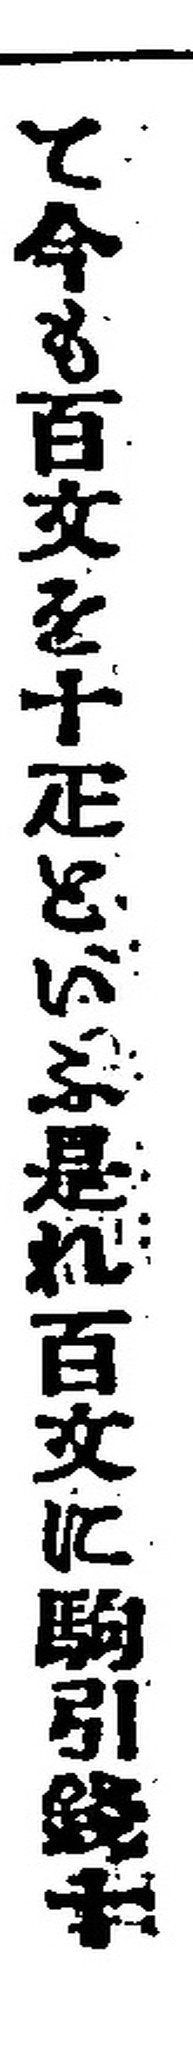て今も百文を十疋といふ是れ百文に駒引銭十

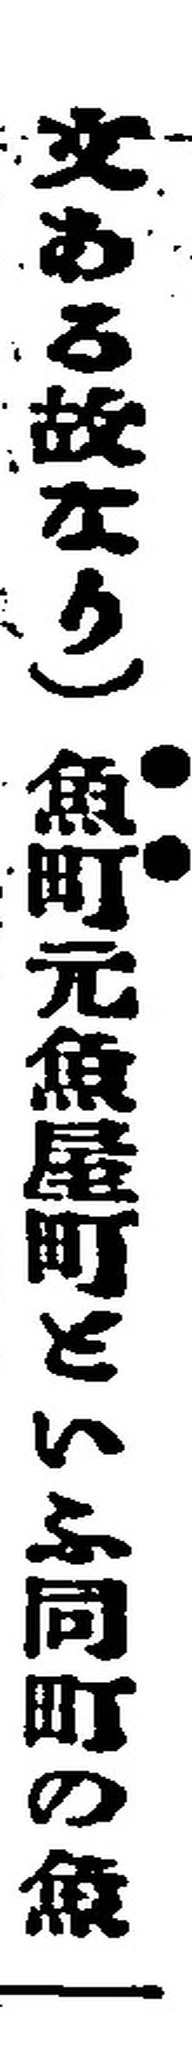文ある故なり)魚町元魚屋町といふ同町の魚
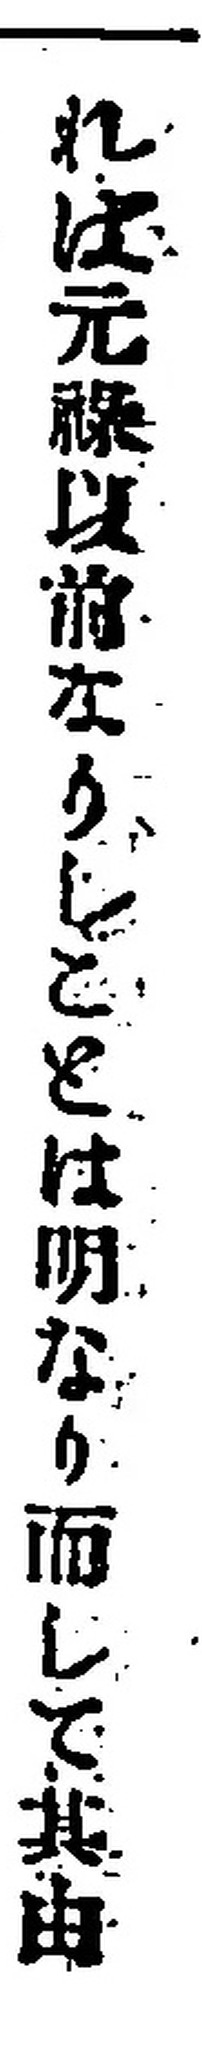れば元禄以前なりしことは明なり而して其由
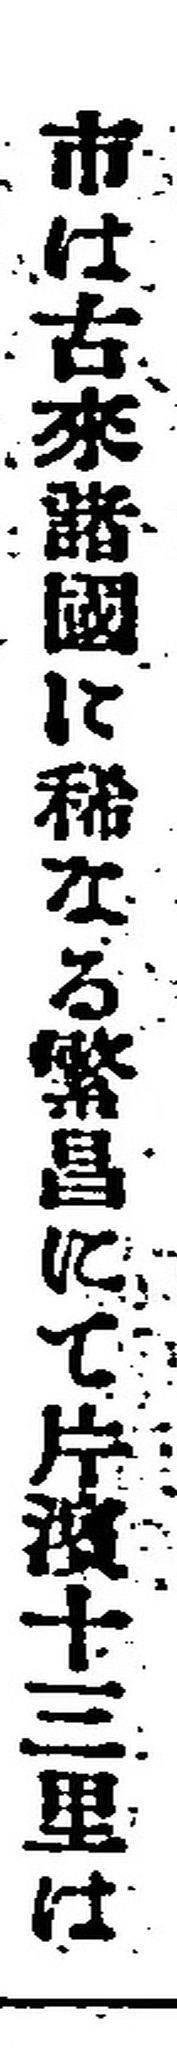市は古来諸国に稀なる繁昌にて片浜十三里は
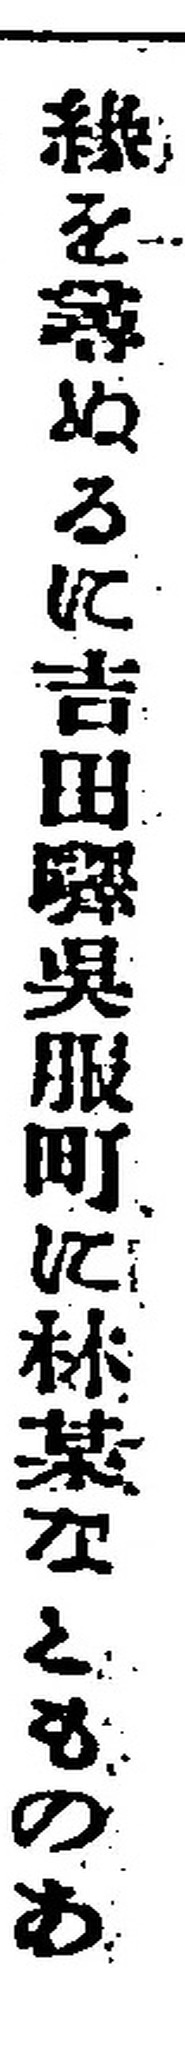縁を尋ぬるに吉田駅呉服町に林某なるものあ
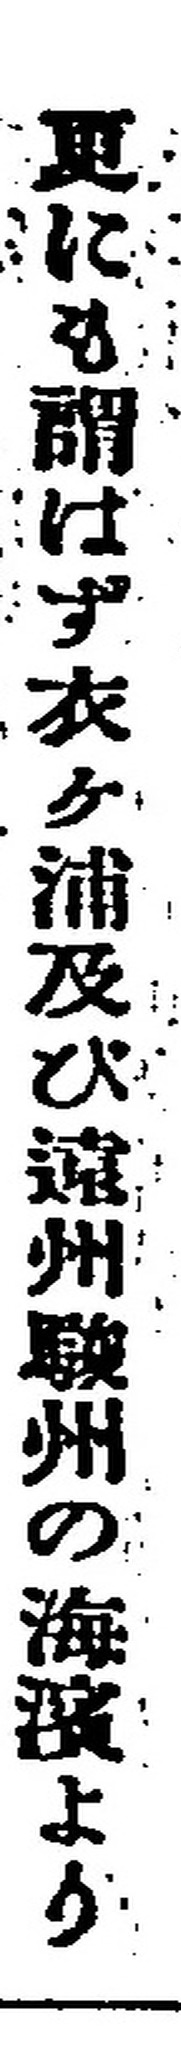夏にも謂はず衣ヶ浦及び遠州駿州の海浜より
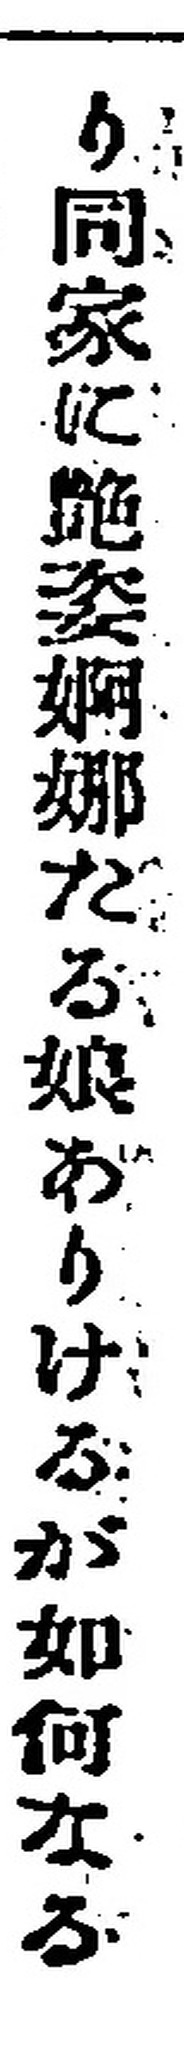り同家に艶姿婀娜たる娘ありけるが如何なる
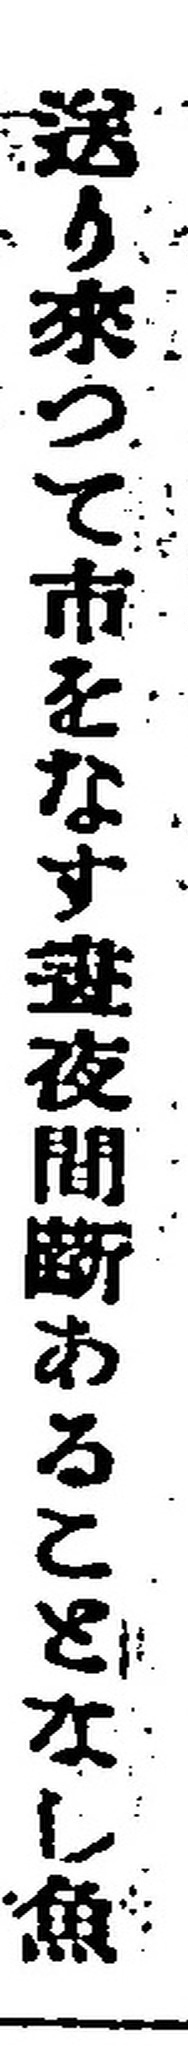送り来つて市をなす昼夜間断あることなし魚
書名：東参名勝案内
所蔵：国立国会図書館 National Diet Library, JAPAN
